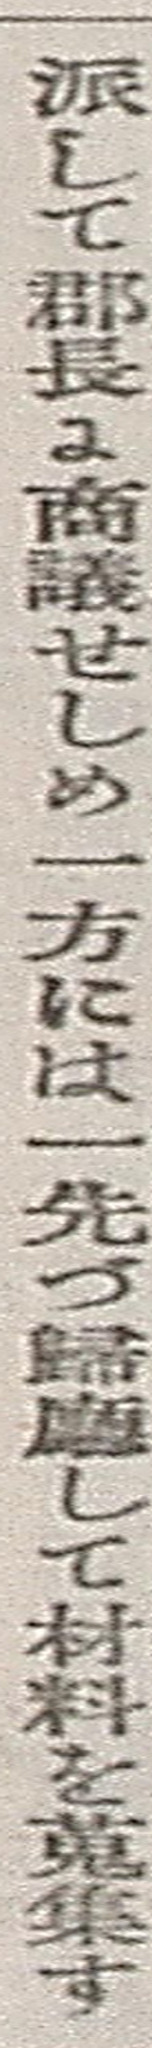派して郡長に商議せしめ一方には一先づ帰庁して材料を蒐集す
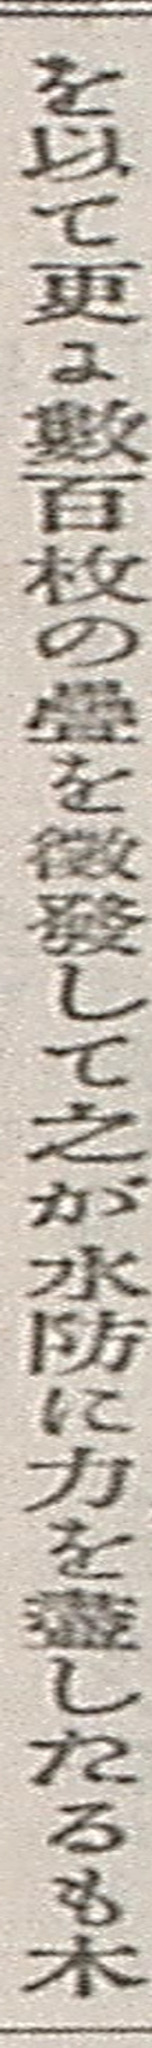を以て更に数百枚の畳を徴発して之が水防に力を尽したるも木
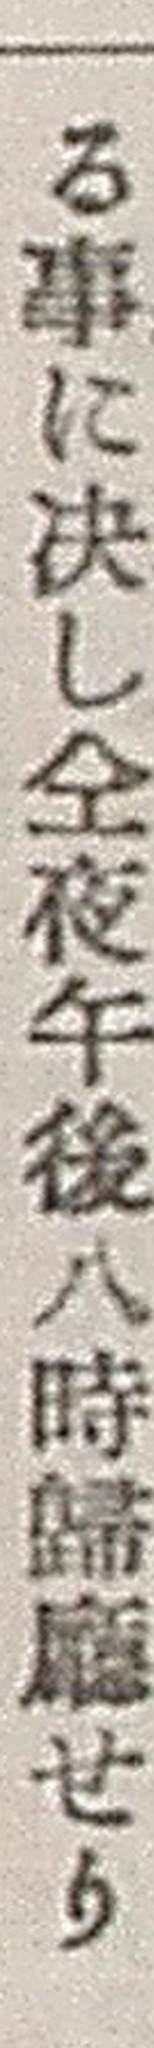る事に決し仝夜午後八時帰庁せり
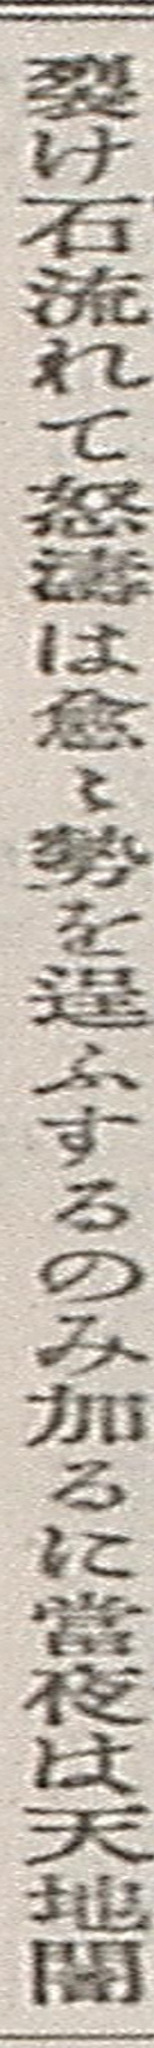裂け石流れて怒濤は愈々勢を逞ふするのみ加るに当夜は天地暗
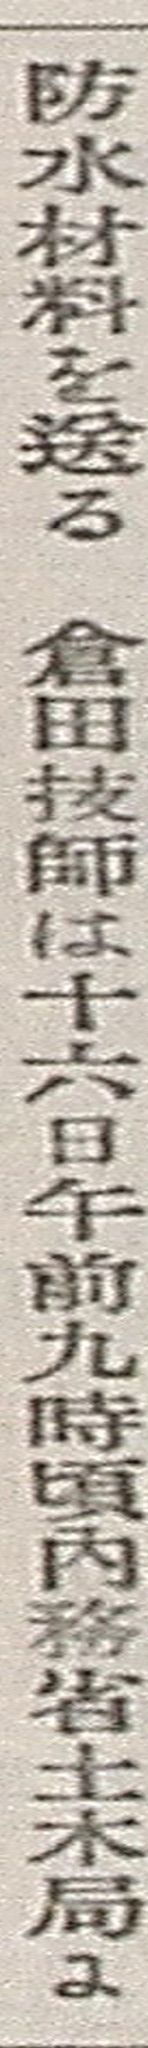防水材料を送る倉田技師は十六日午前九時頃内務省土木局に
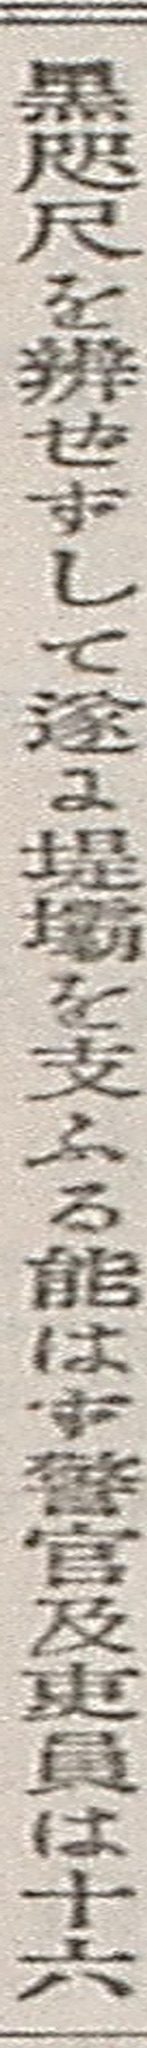黒咫尺を弁ぜずして遂に堤壩を支ふる能はず警官及吏員は十六
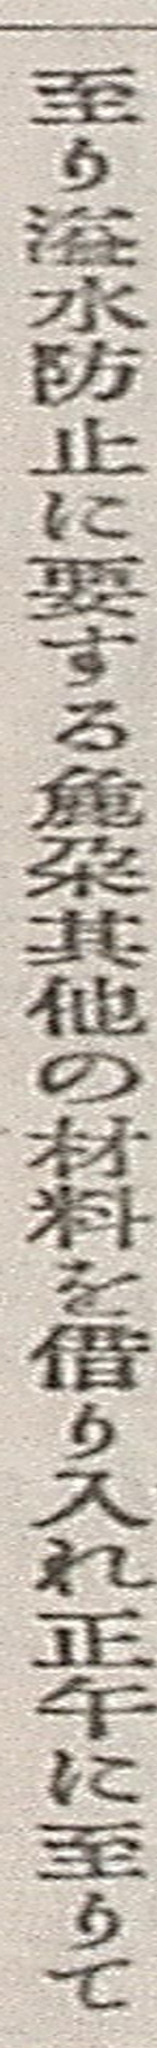至り溢水防止に要する麁朶其他の材料を借り入れ正午に至りて
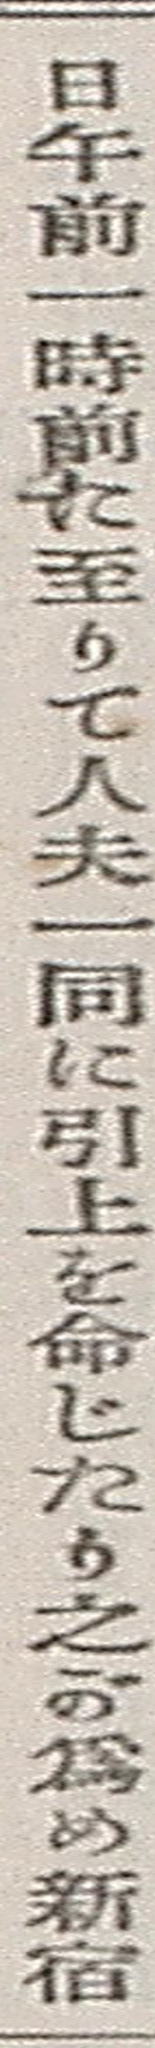日午前一時前に至りて人夫一同に引上を命じたり之が為め新宿
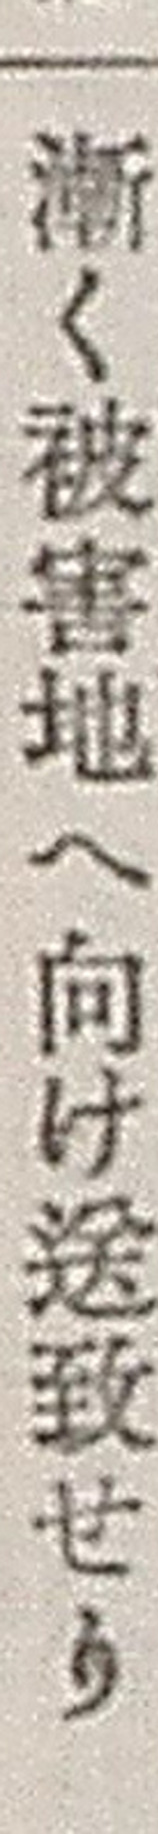漸く被害地へ向け送致せり
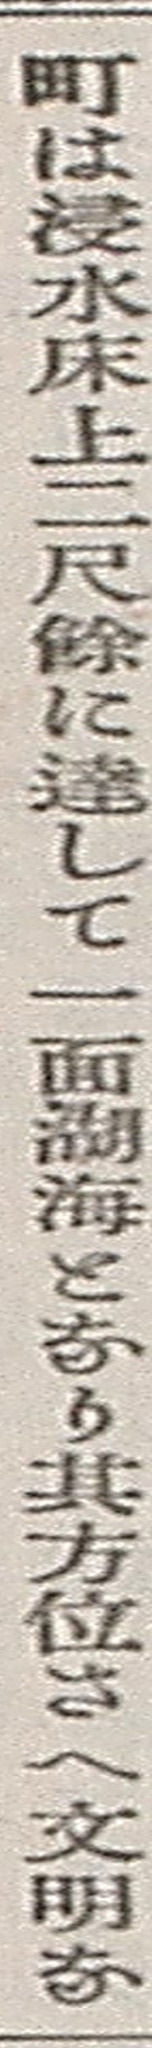町は浸水床上二尺余に達して一面湖海となり其方位さへ文明な
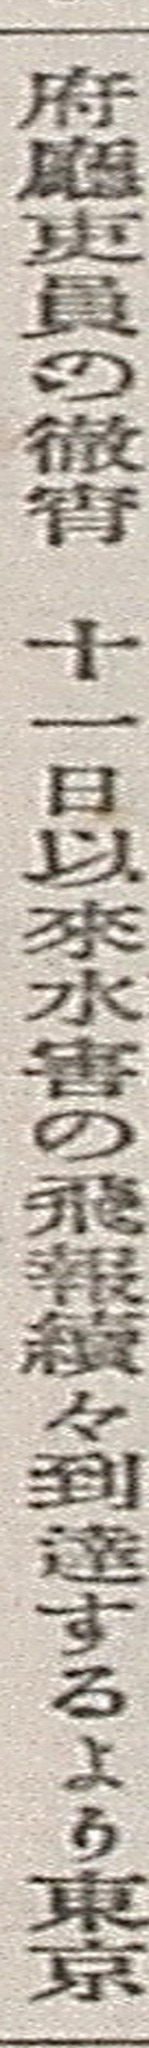府庁吏員の徹宵十一日以来水害の飛報続々到達するより東京
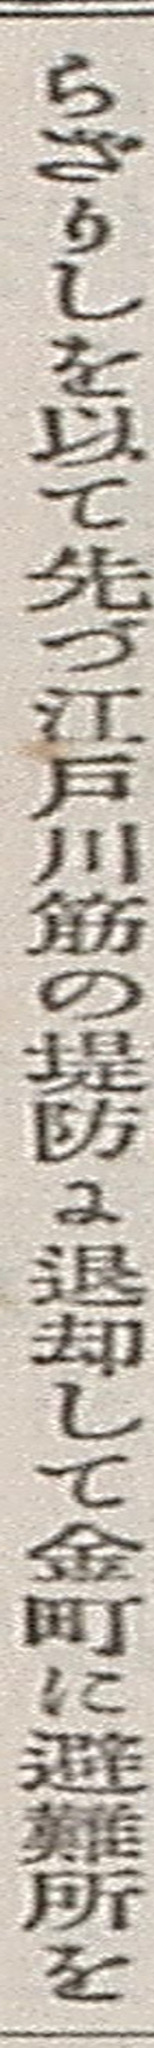らざりしを以て先づ江戸川筋の堤防に退却して金町に避難所を
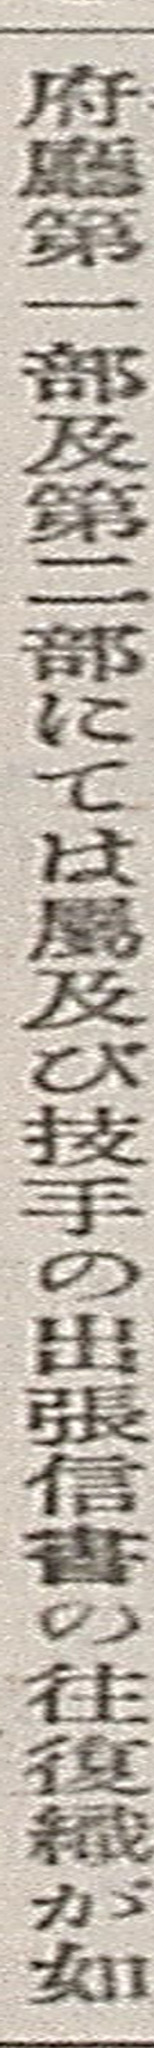府庁第一部及第二部にては属及び技手の出張信書の往復織が如
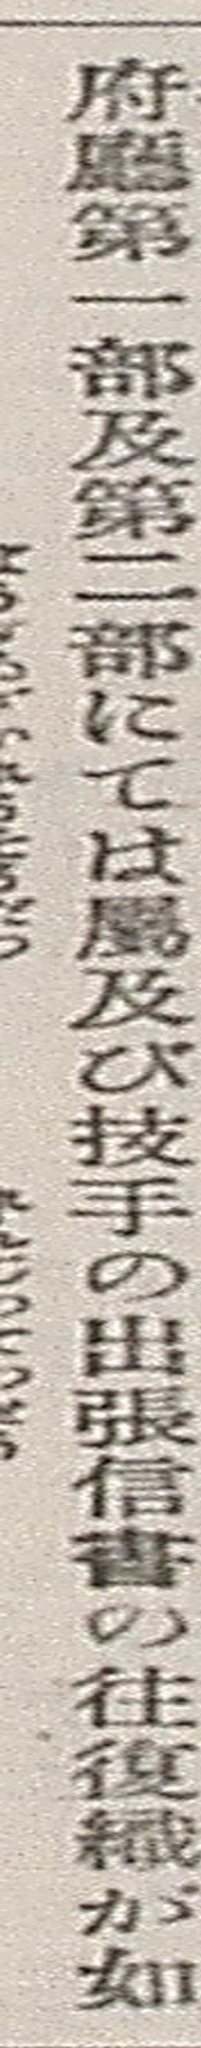府庁第一部及第二部にては属及び技手の出張信書の往復織が如
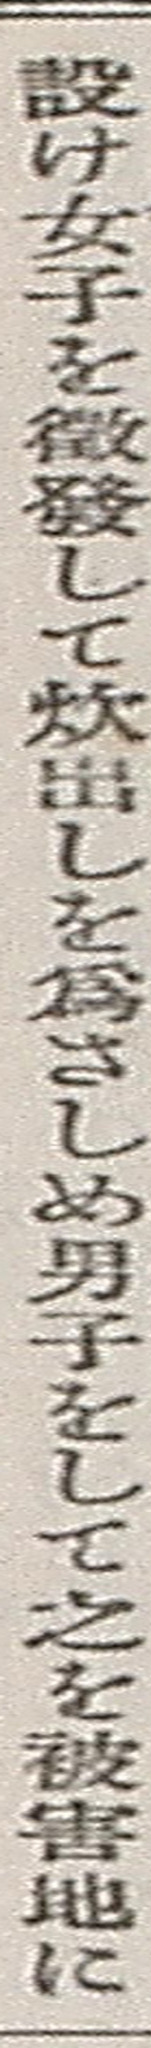設け女子を徴発して炊出しを為さしめ男子をして之を被害地に
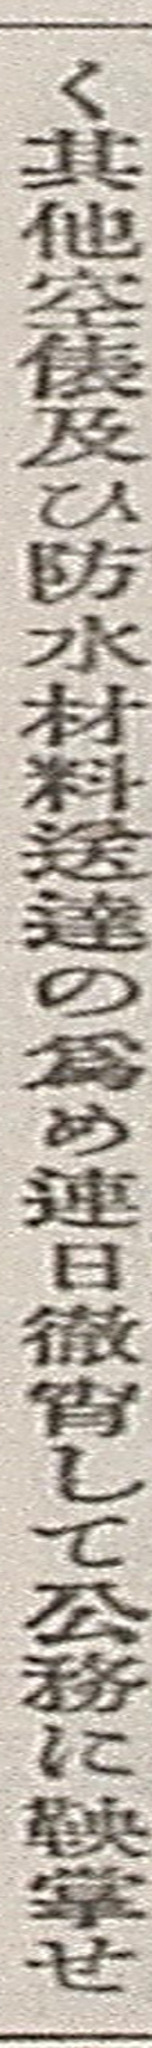く其他空俵及ひ防水材料送達の為め連日徹宵して公務に鞅掌せ
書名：風俗畫報臨時増刊第百二十四號　洪水地震被害録（上）
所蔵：東京大学地震研究所図書室 Earthquake Research Institute Library, The University of Tokyo, JAPAN
